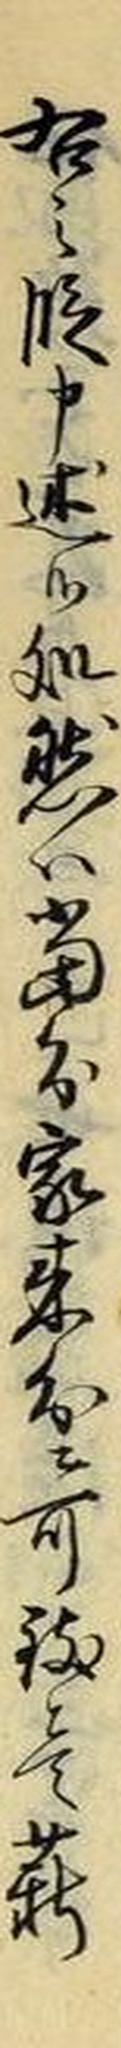右之段申述候処然は当分家来分に可致にて薪
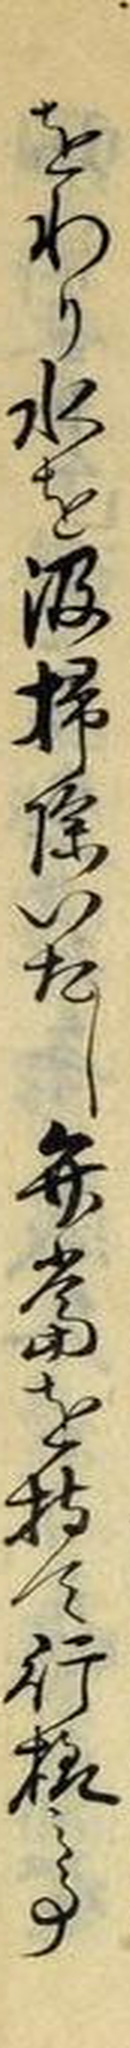をわり水を汲掃除いたし弁当を持て行様之事
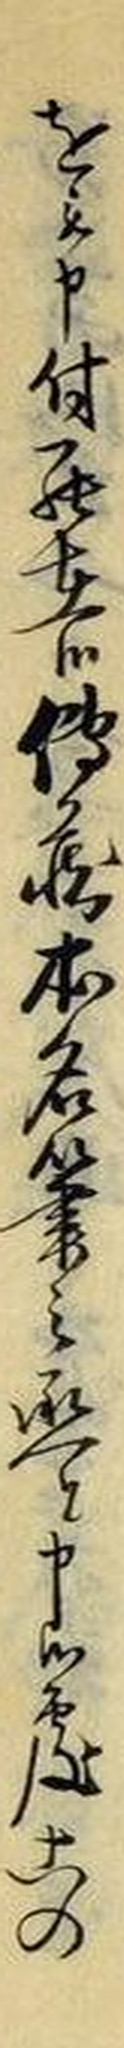を被申付罷在候伝蔵本名筆之丞と申候処この
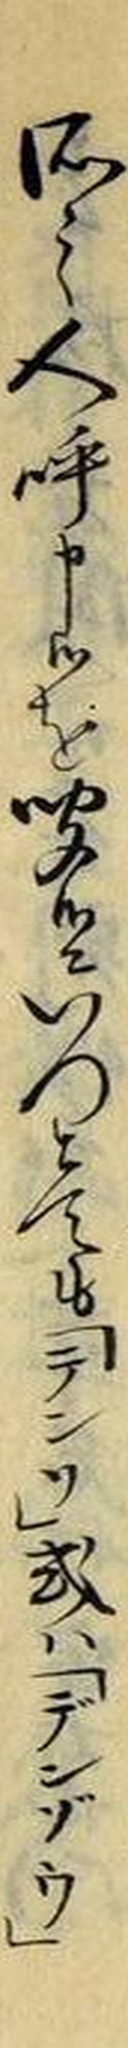所之人呼申候を聞候にいつとても「テンソ」或は「デンゾウ」

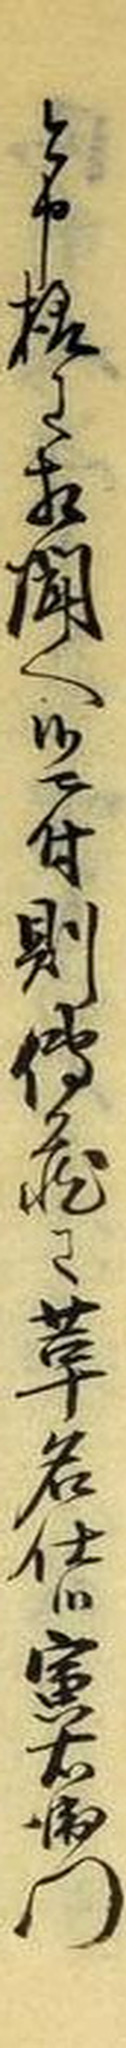と申様に相聞へ候ニ付則傳蔵に革名仕候寅右衛門
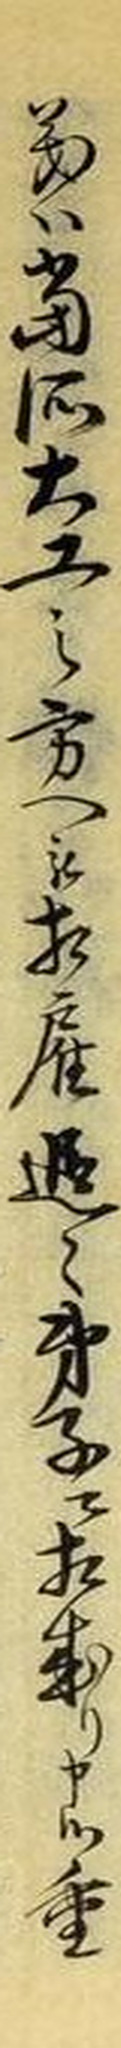義ハ当所大工之方へ被相雇追々弟子ニ相成り申候重
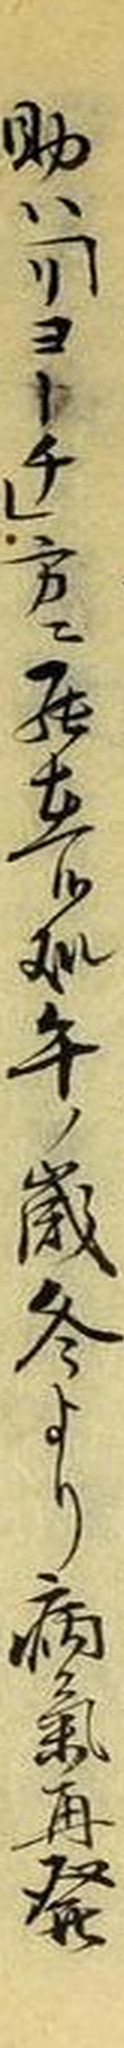助ハ「リヨーチ」方ニ罷在候処午ノ歳冬より病気再発
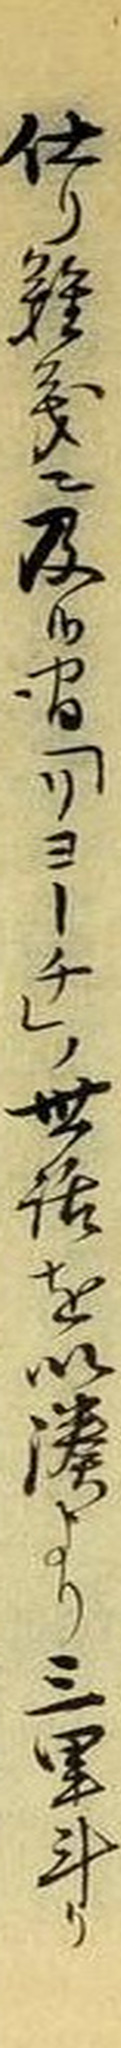仕り難義ニ及候間「リヨーチ」ノ世話を以湊より三里計り
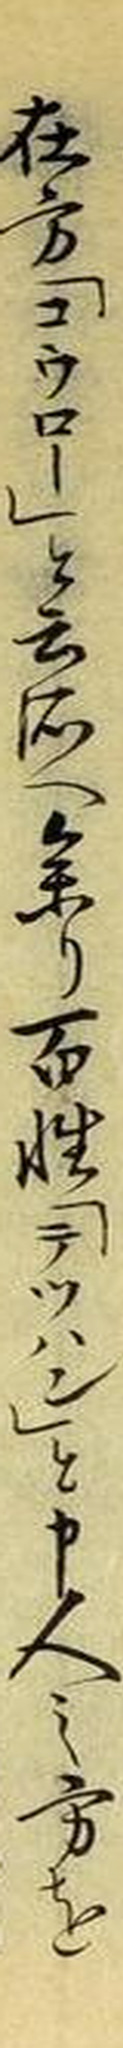在方「コウロー」と云所へ参り百姓「テツハン」と申人之方を
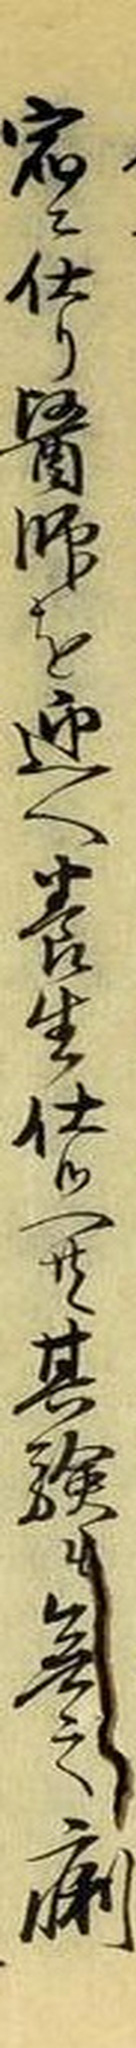宿ニ仕り医師を迎へ養生仕候へ共其験も無之痢
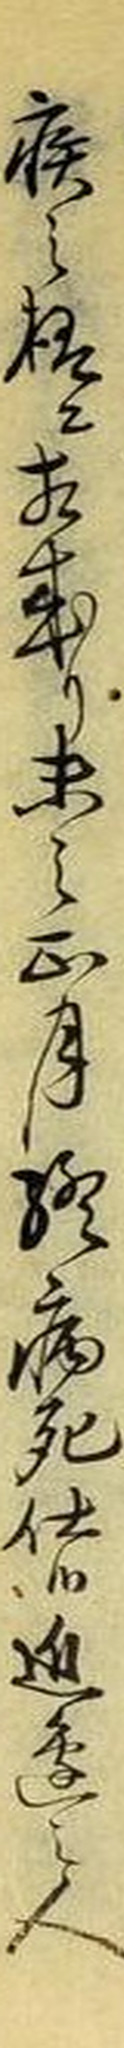疾之様ニ相成り未之正月終病死仕候近辺之人
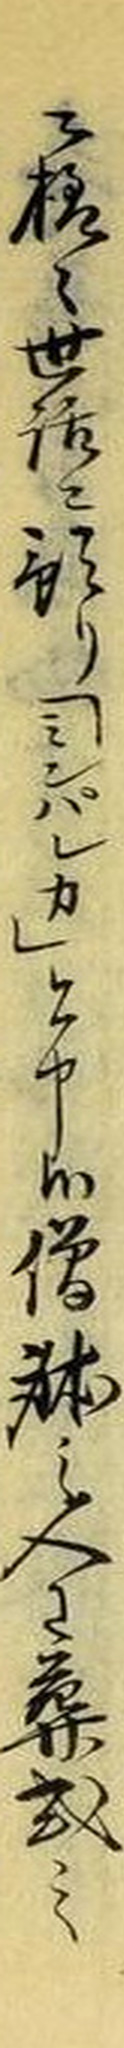ニ様々世話ニ預り「ミンパレカ」と申候僧躰之人に葬式之
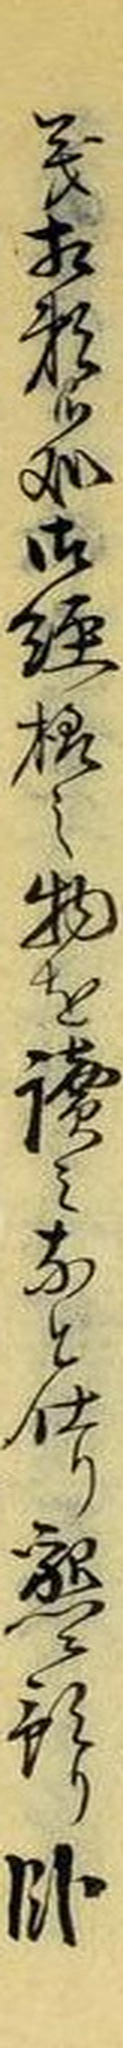義相頼候処御経様之物を読ミなと仕り懇ニ預り臥
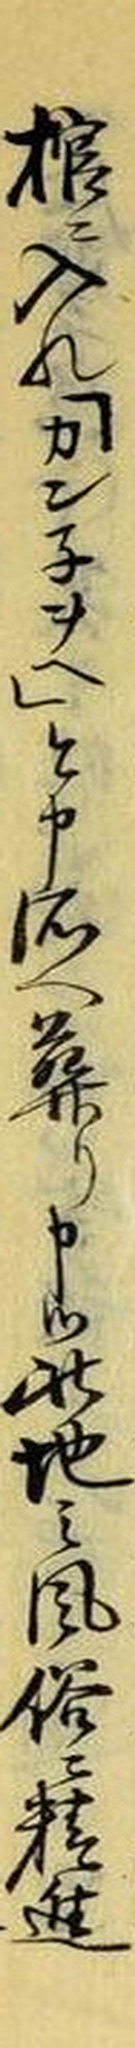棺ニ入れ「カン子ヲへ」と申所へ葬り申候此地之風俗ニ精進
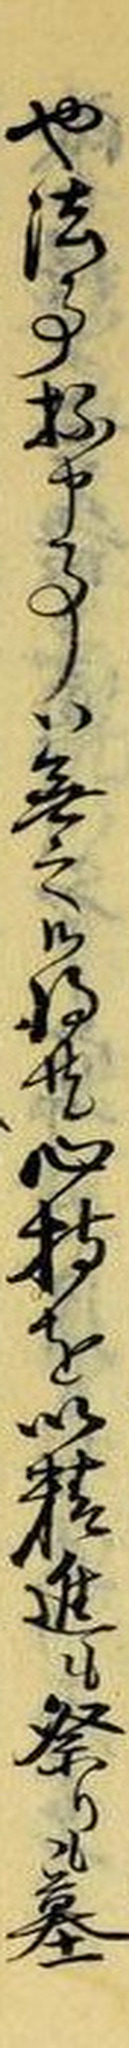や法事抔申事ハ無之候得共心持を以精進も祭りも墓
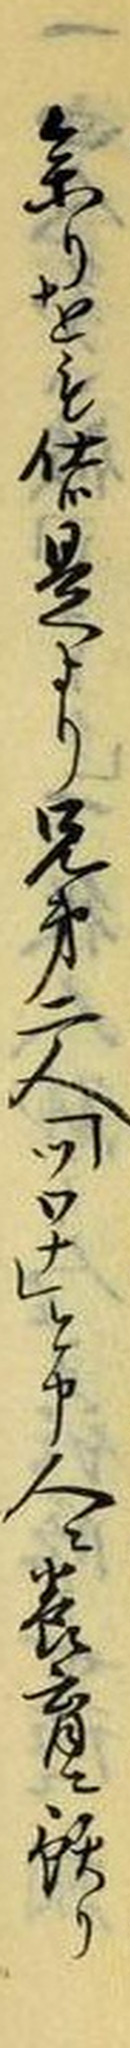参りをも仕候是より兄弟二人「ツワナ」と申人二養育ニ預り
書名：漂客談奇（備考雑録写8）
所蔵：福井県文書館 Fukui Prefectural Archives
